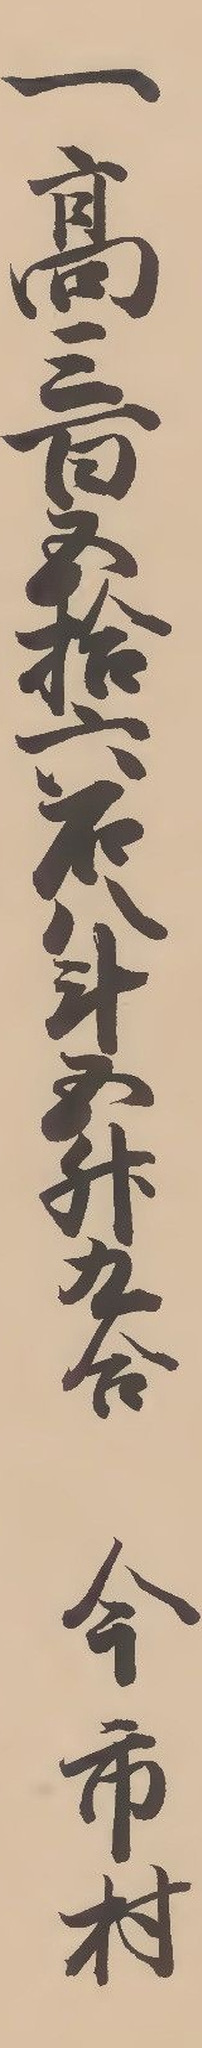一高三百五拾六石八斗五升九合今市村
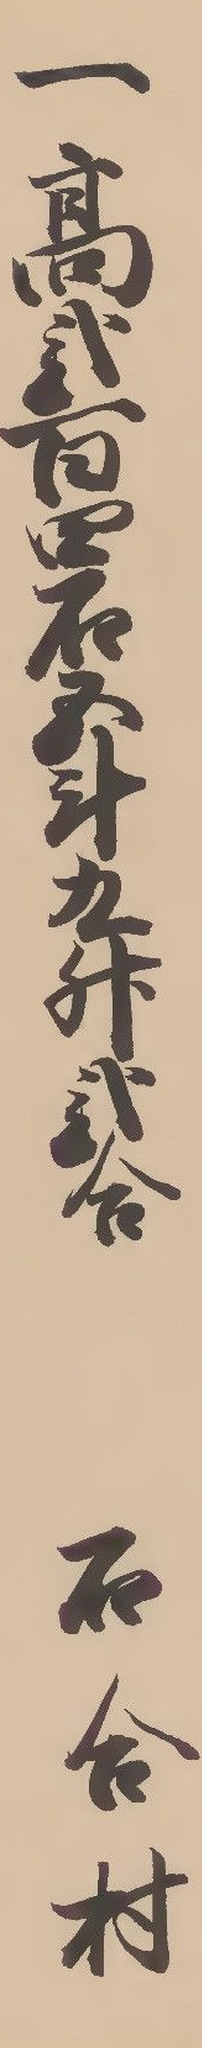一高弐百四石五斗九升弐合石合村

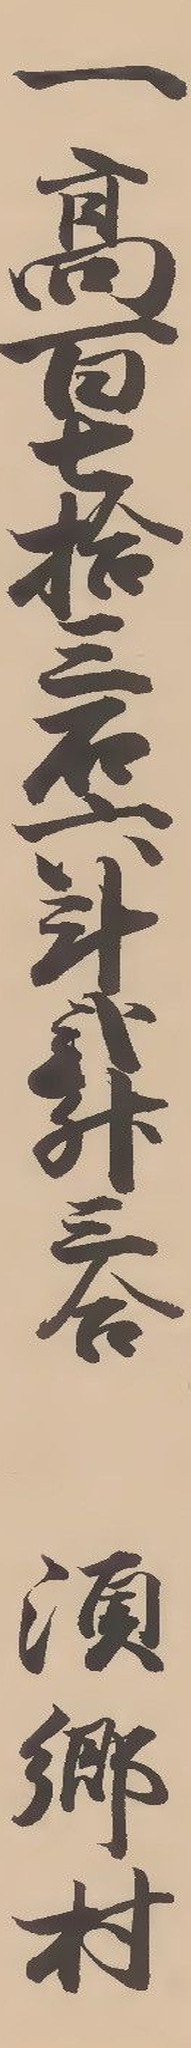一高百七拾三石六斗弐升三合須郷村
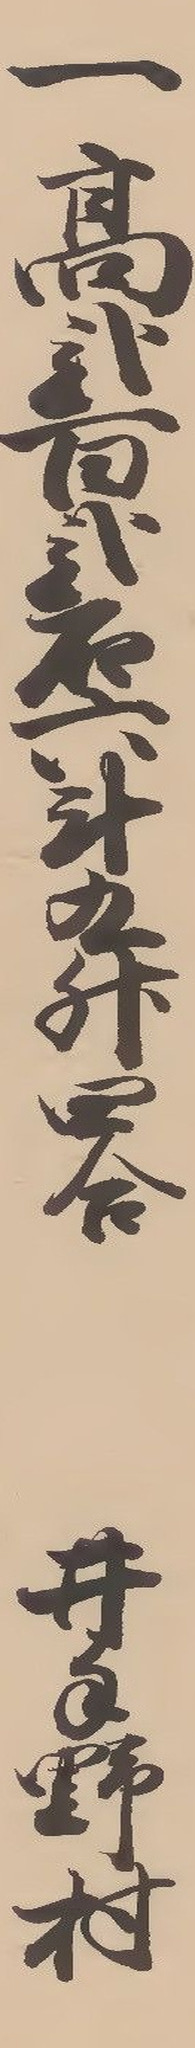一高弐百弐石六斗九升四合井手野村
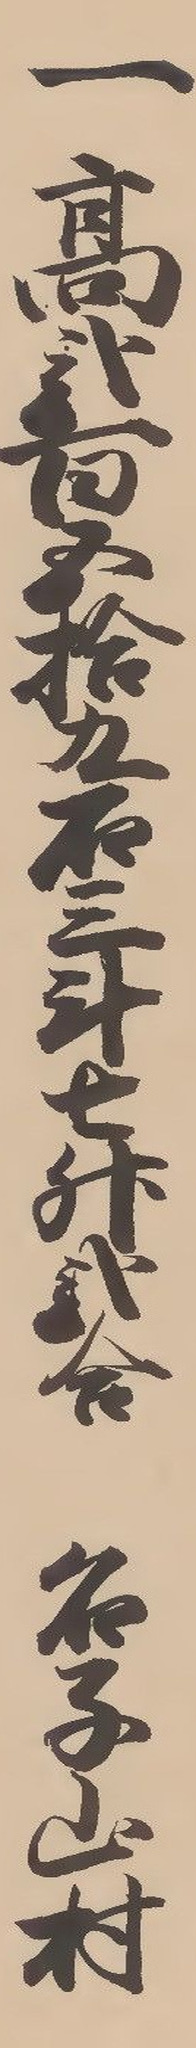一高弐百五拾九石三斗七升弐合名子山村
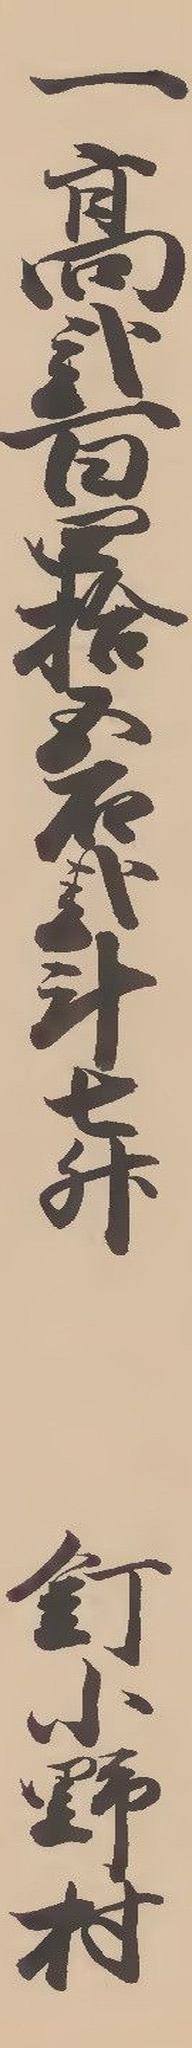一高弐百四拾五石弐斗七升釘小野村
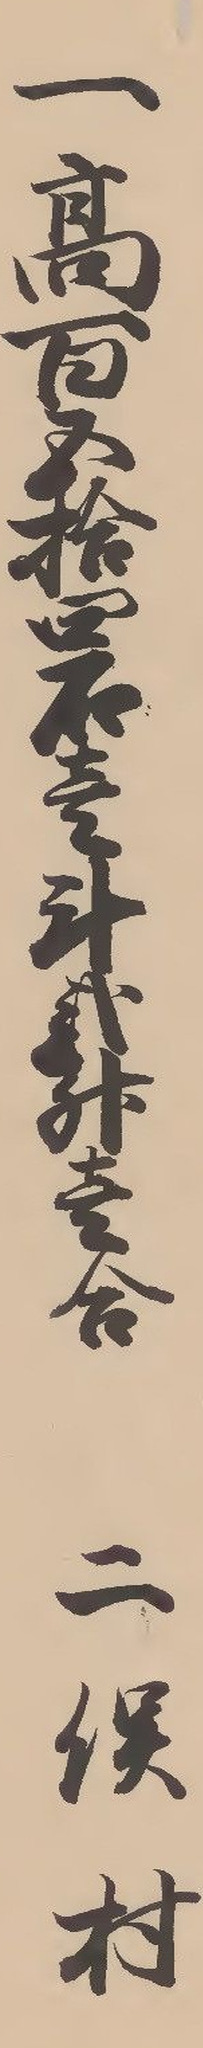一高百五拾四石壱斗弐升壱合二俣村
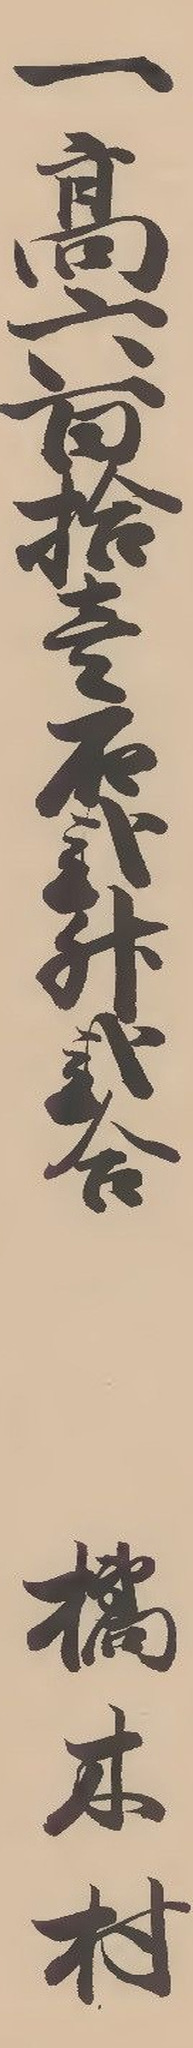一高六百拾壱石弐升弐合橘木村
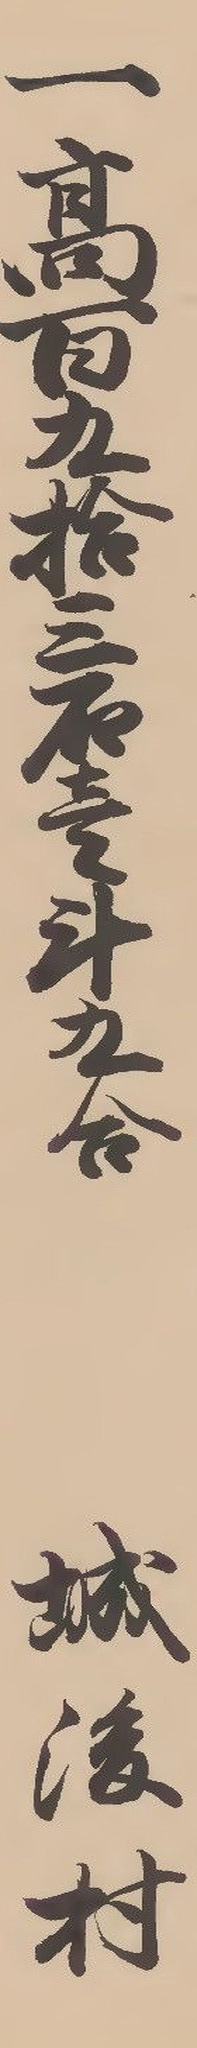一高百九拾三石壱斗九合城後村
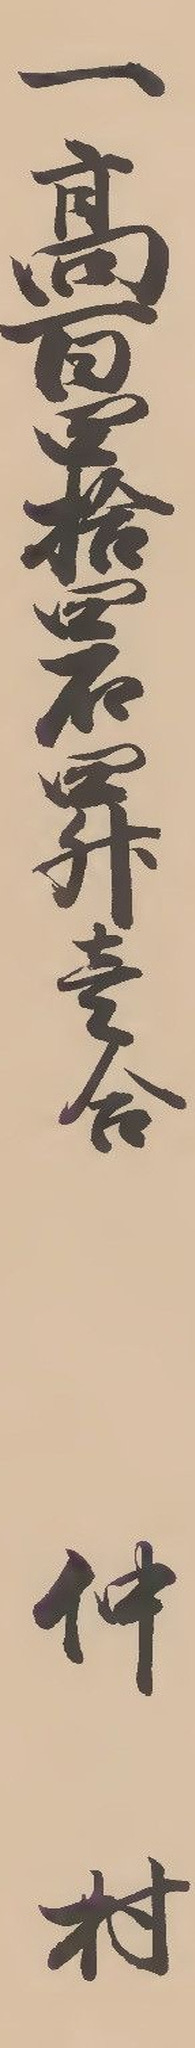一高百四拾四石四升壱合仲村

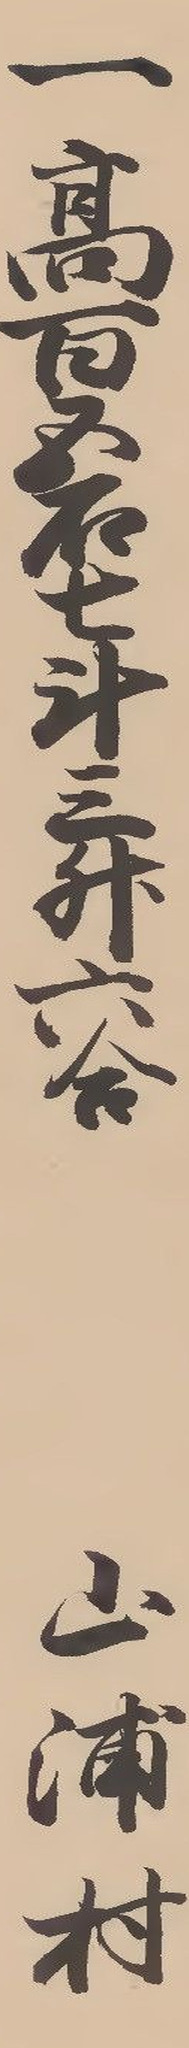一高百五石七斗三升六合山浦村
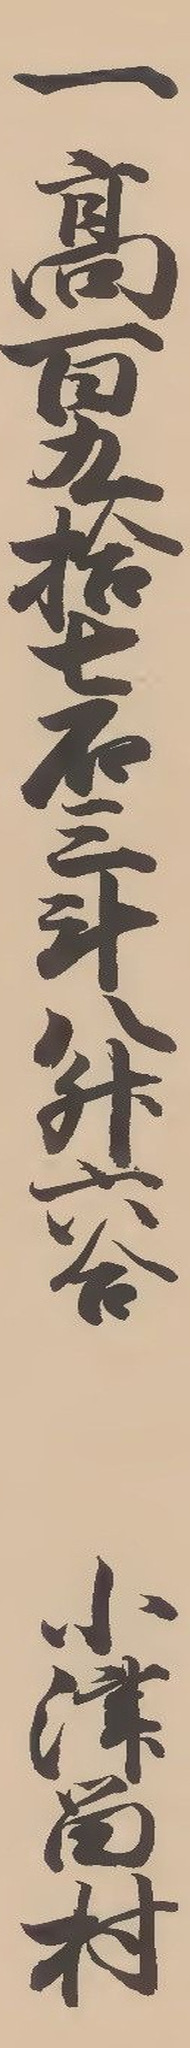一高百九拾七石三斗八升六合小津留村
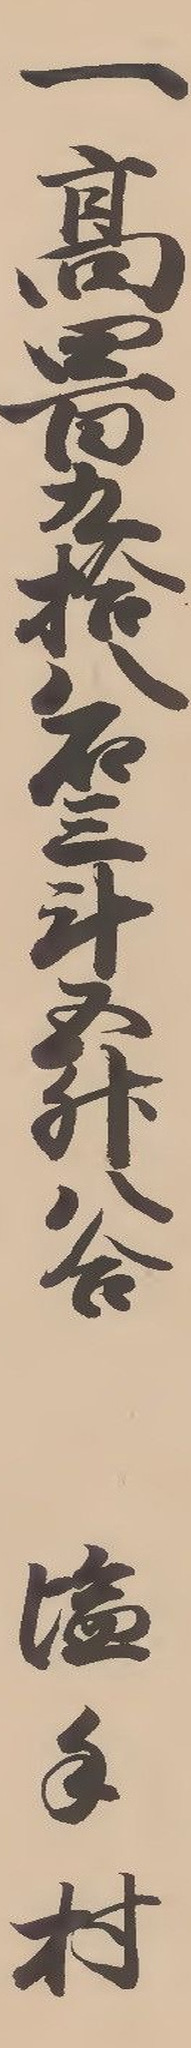一高四百九拾八石三斗五升八合塩手村
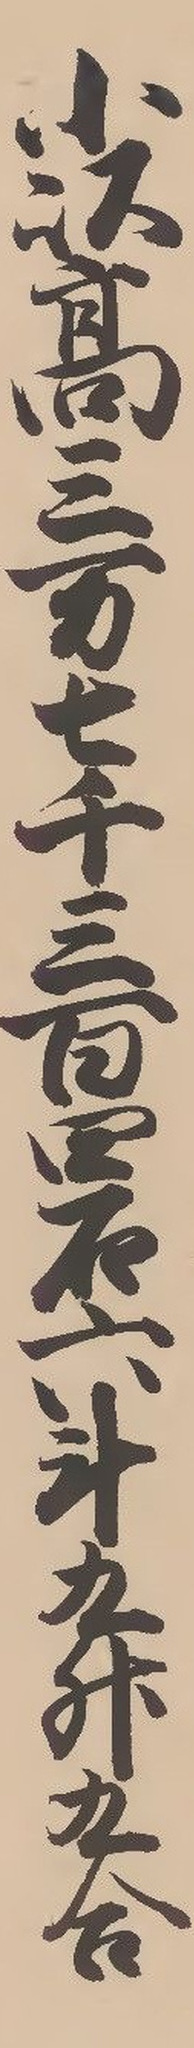小以高三万七千三百四石六斗九升九合

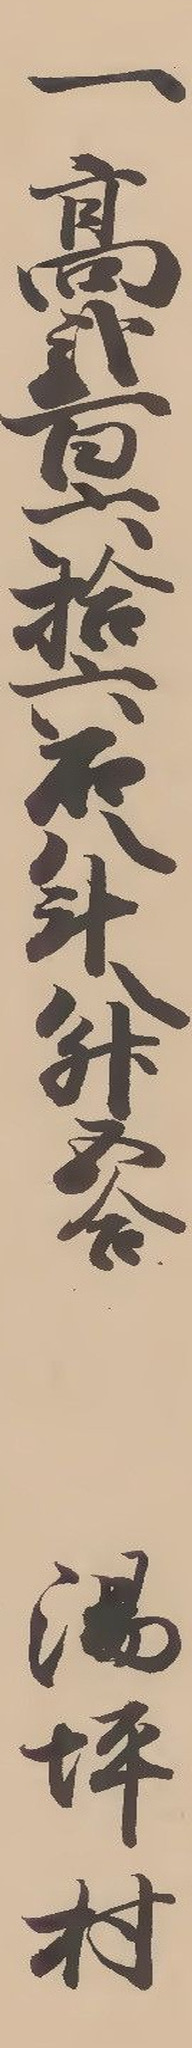一高弐百六拾六石八斗八升五合湯坪村
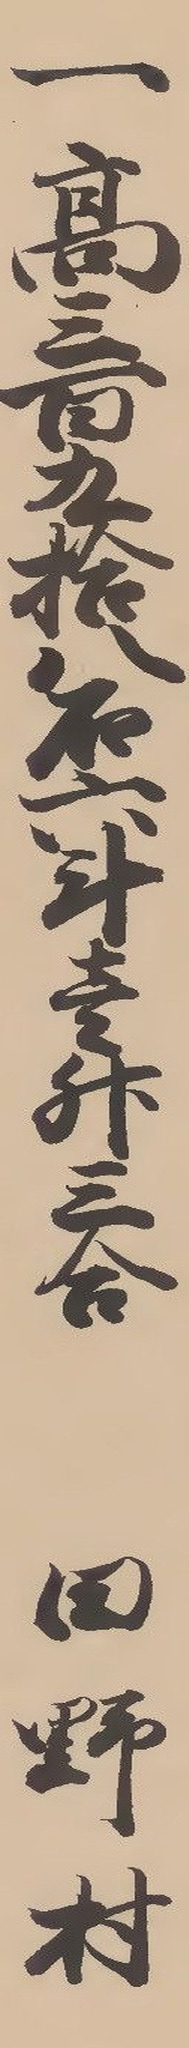一高三百九拾八石六斗壱升三合田野村
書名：豊後国郷帳
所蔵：国立公文書館 National Archives of Japan
